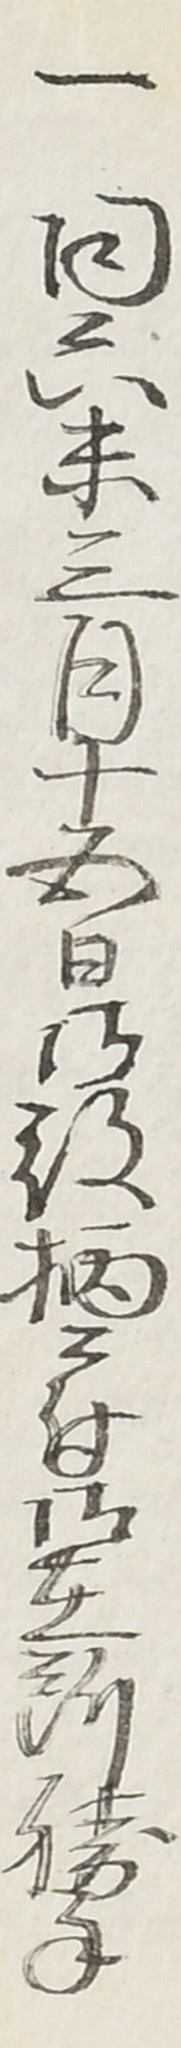一同六未三月十五日御役柄ニ付御在所勝手
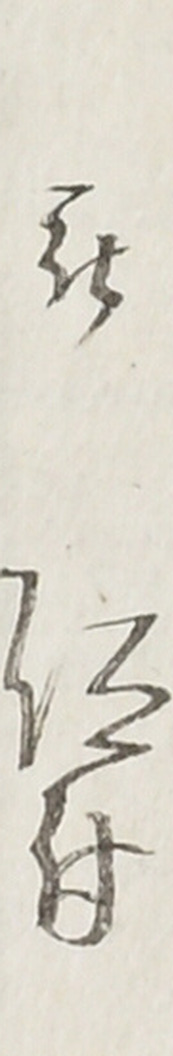被仰付
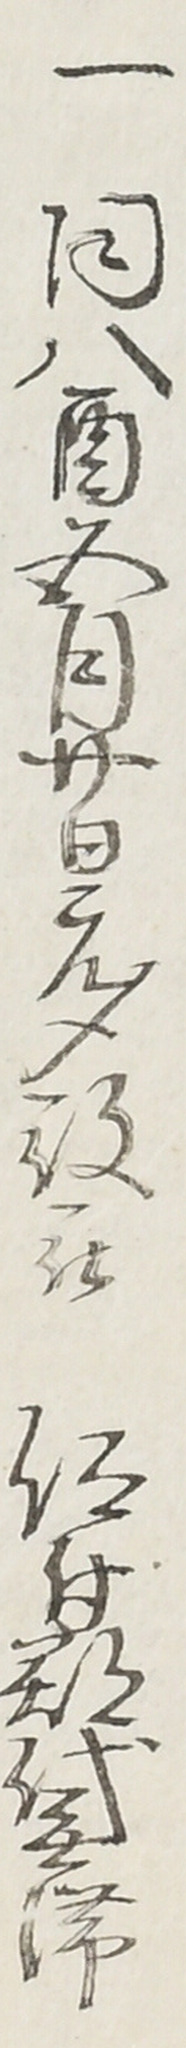一同八酉五月廿日元〆役被仰付郡代無滞
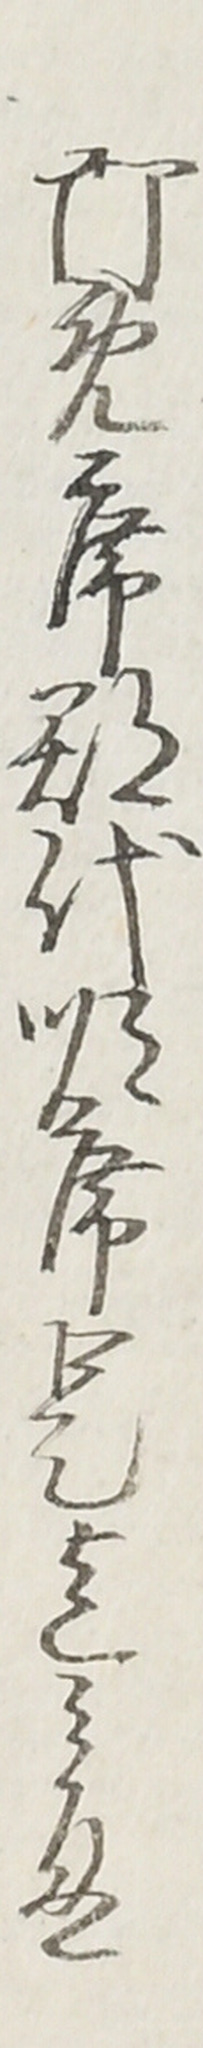御免席郡代順席是迄之通
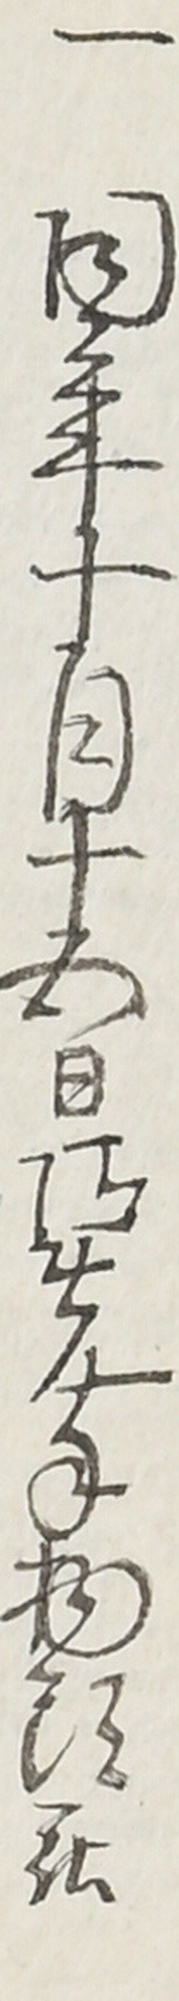一同年十月十五日御先手物頭被
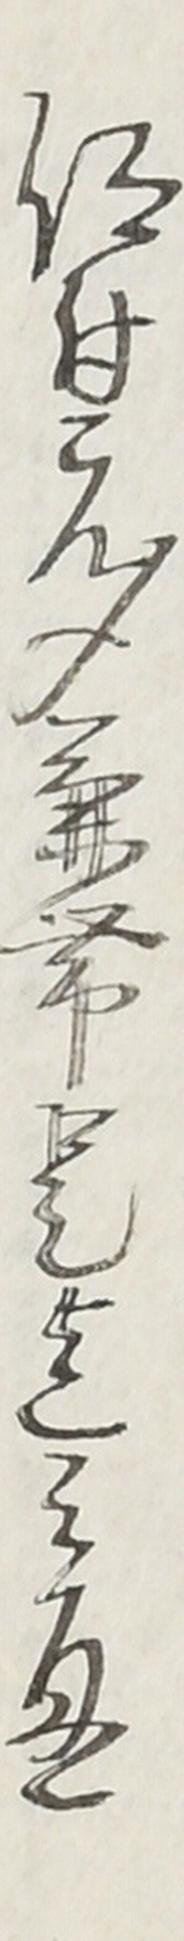仰付元〆兼帯是迄之通
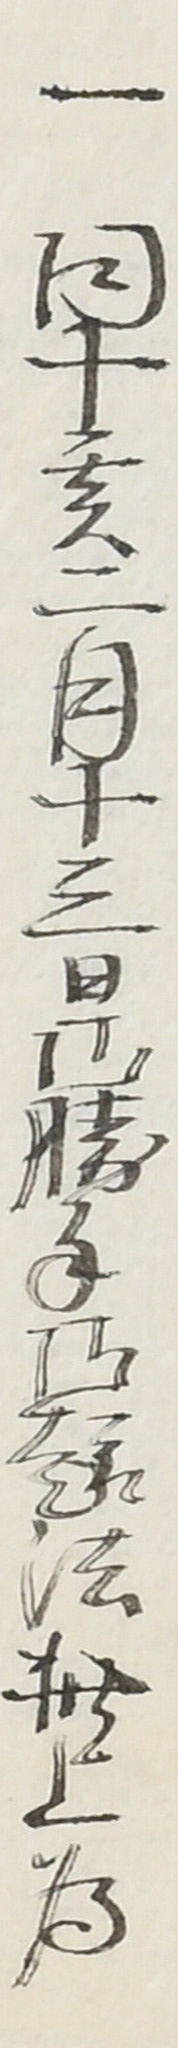一同十亥二月十三日御勝手御趣法此上為
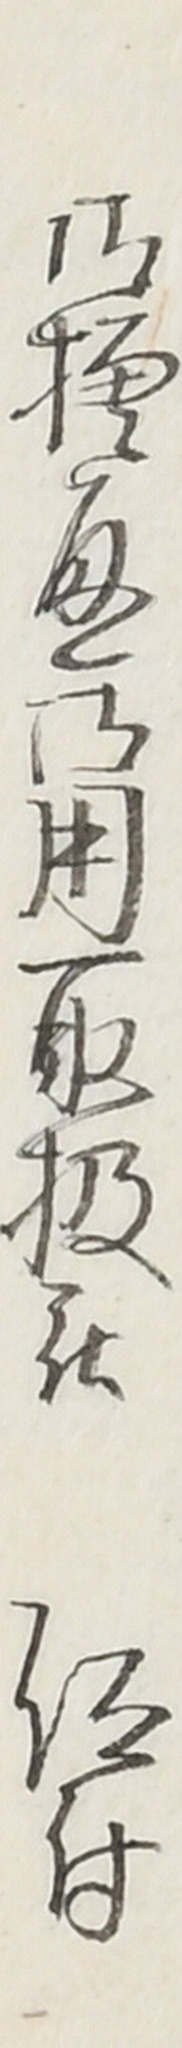御模通御用取扱被仰付
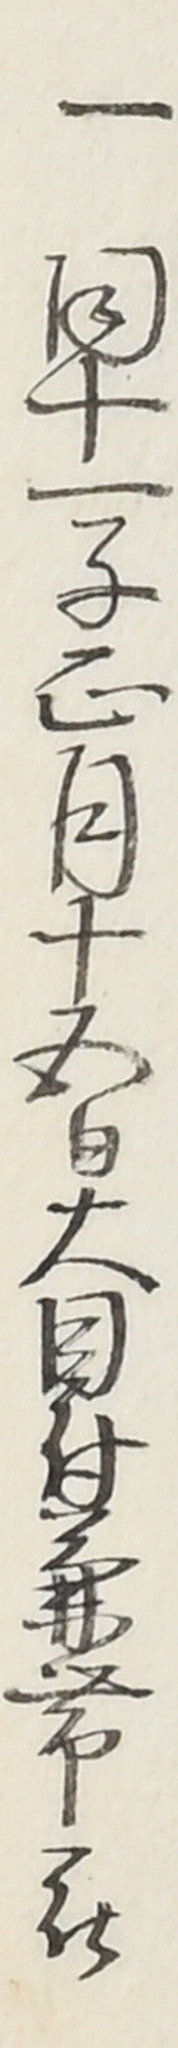一同十一子正月十五日大目付兼帯被

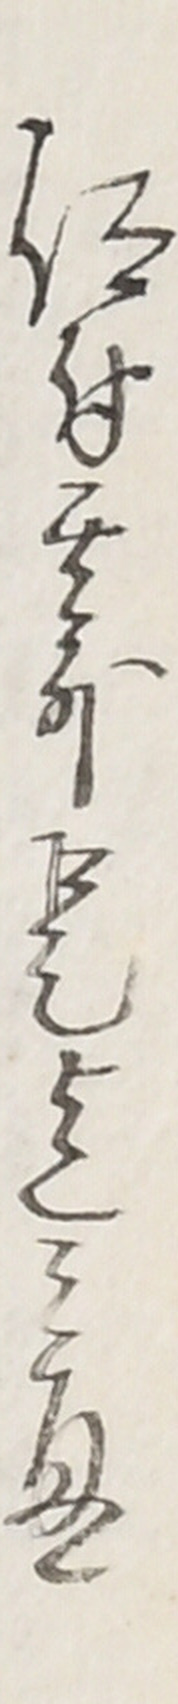仰付其外是迄之通
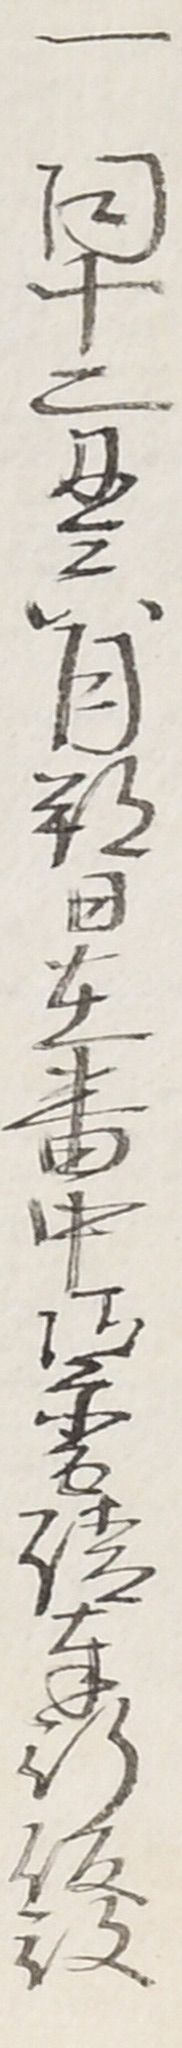一同十二丑六月朔日在番中御普請奉行仮役
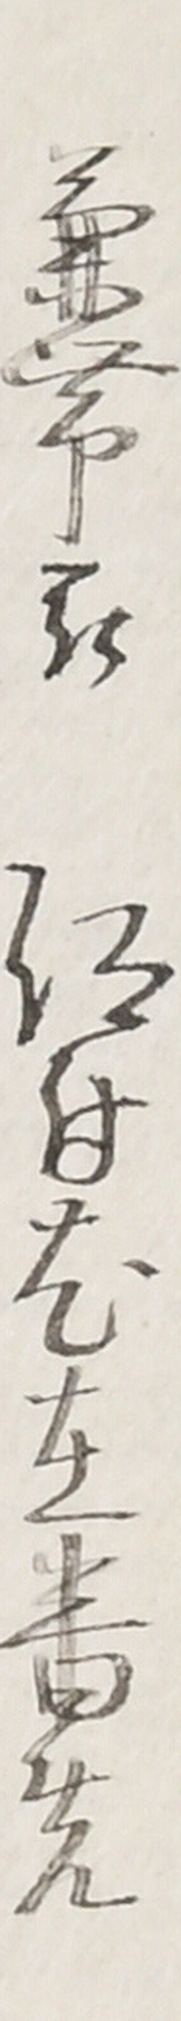兼帯被仰付尤在番先
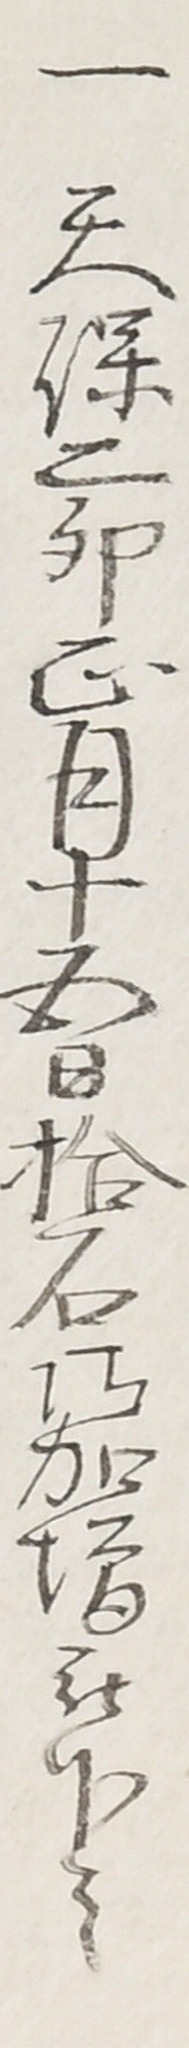一天保二卯正月十五日拾石御加増被下之
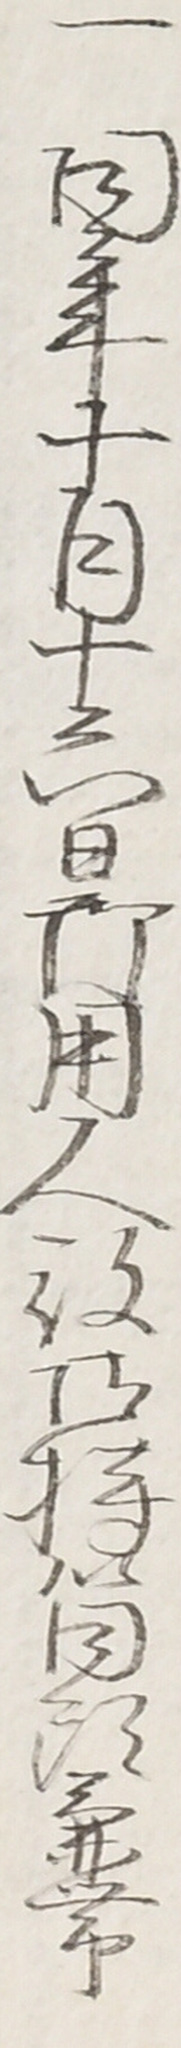一同年十月十六日御用人役御持筒頭兼帯
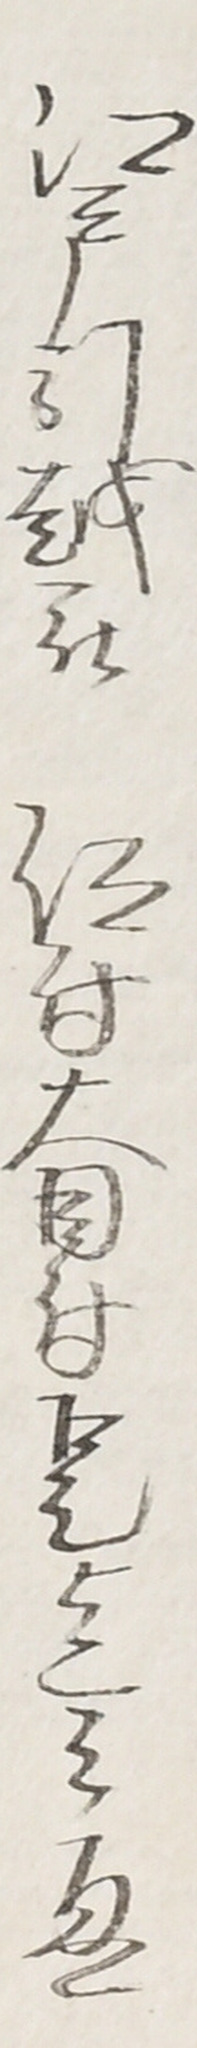江戸引越被仰付大目付是迄之通
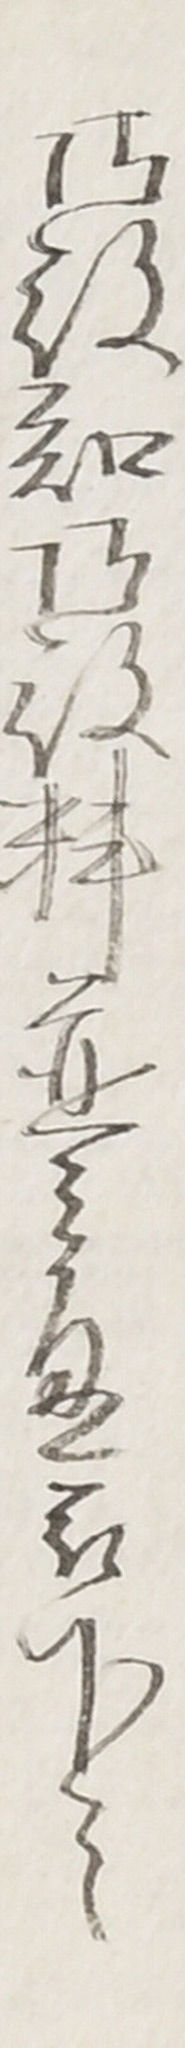御役知御役料並之通被下之
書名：給人諸士勤仕録（七）
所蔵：伊那市立高遠町図書館・合同会社AMANE
